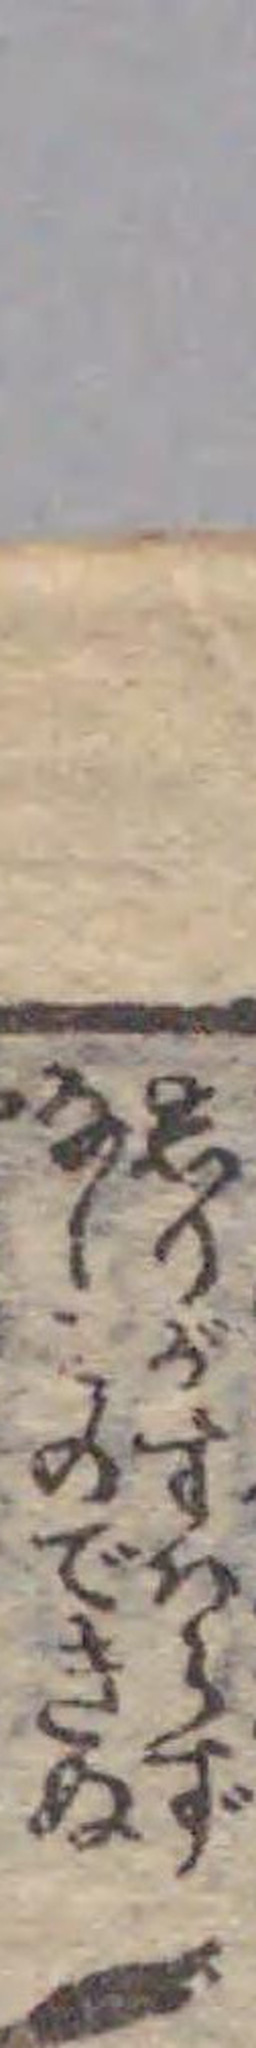なしのできぬ
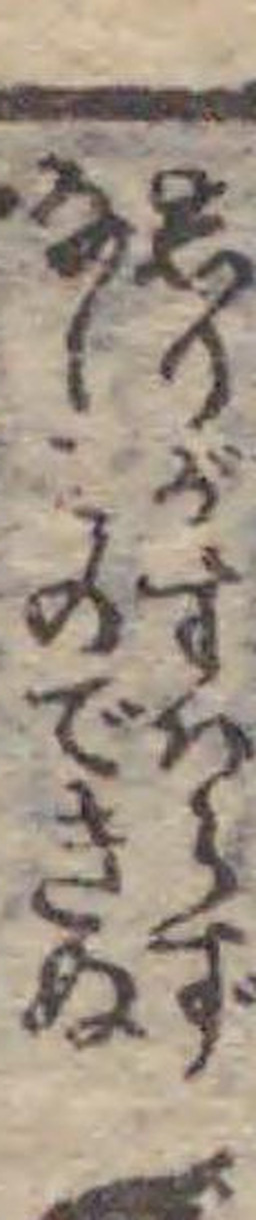なしのできぬ
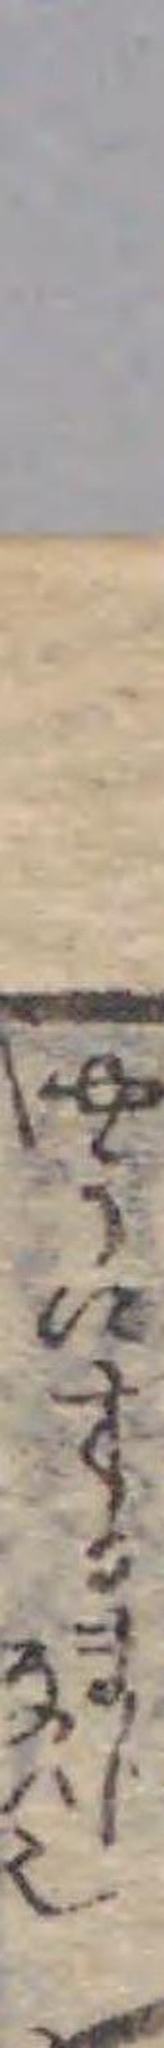やうにするまじ
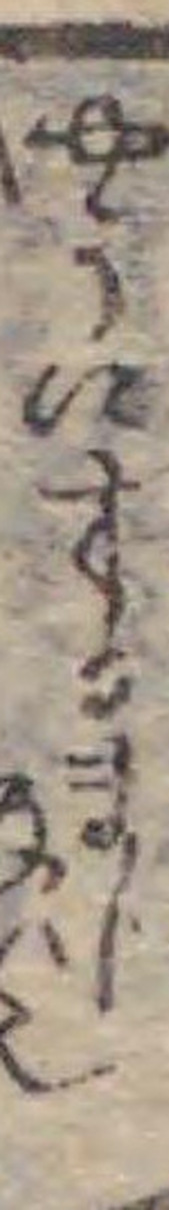やうにするまじ
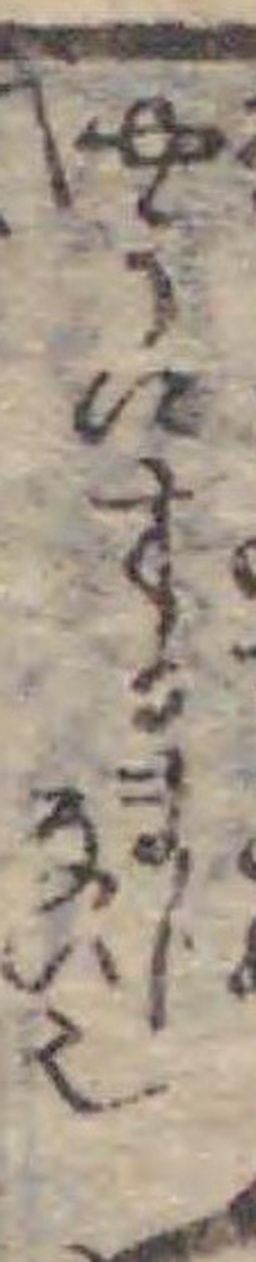やうにするまじ
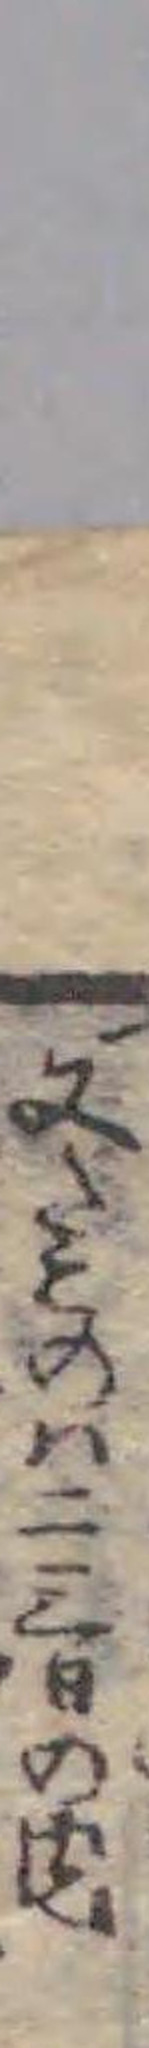〽又たこのは二三日の内
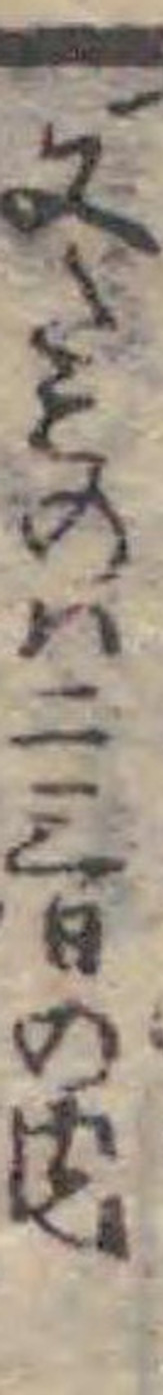〽又たこのは二三日の内
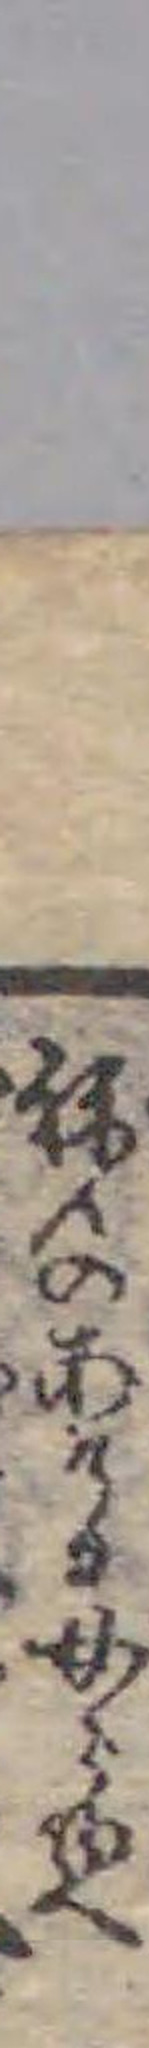ねんのあける女郎ゆへ
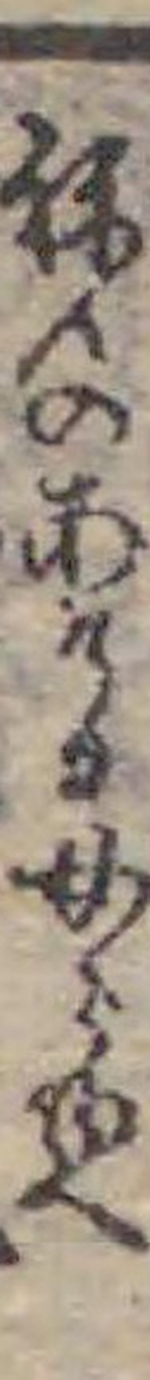ねんのあける女郎ゆへ
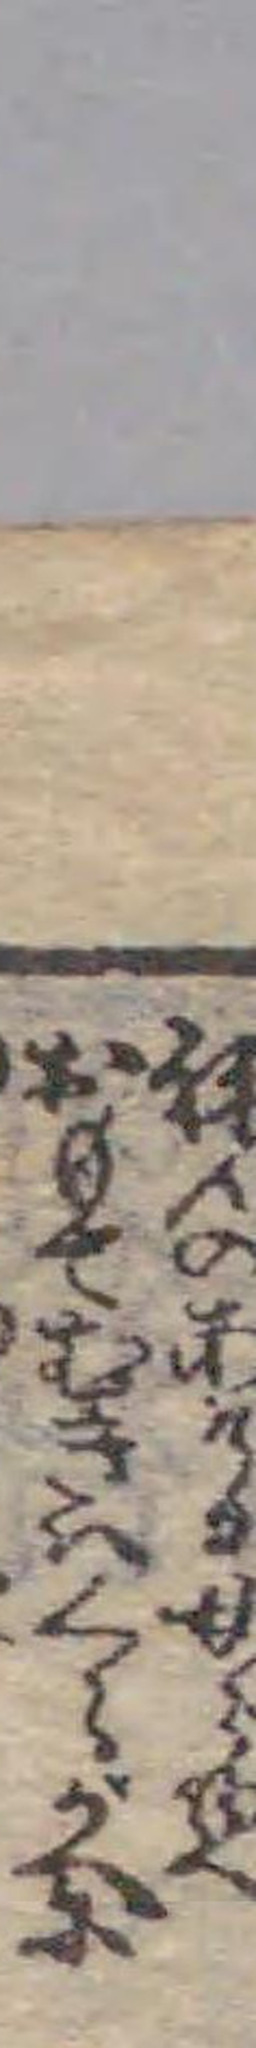おもてむきはくらがへに
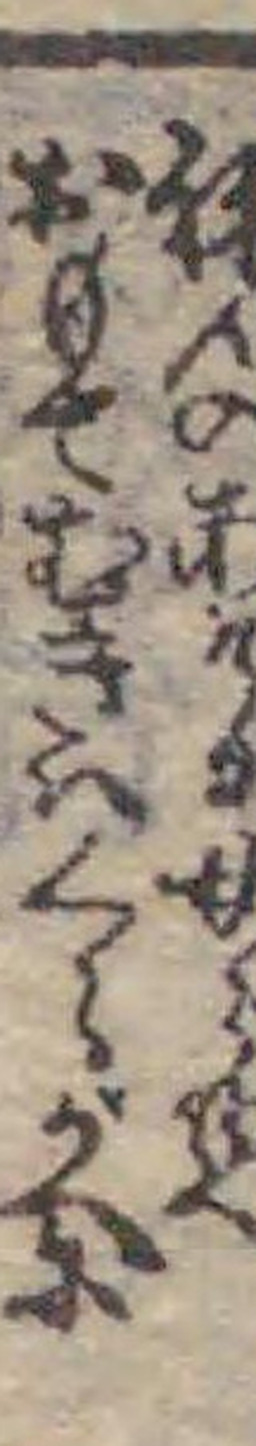おもてむきはくらがへに
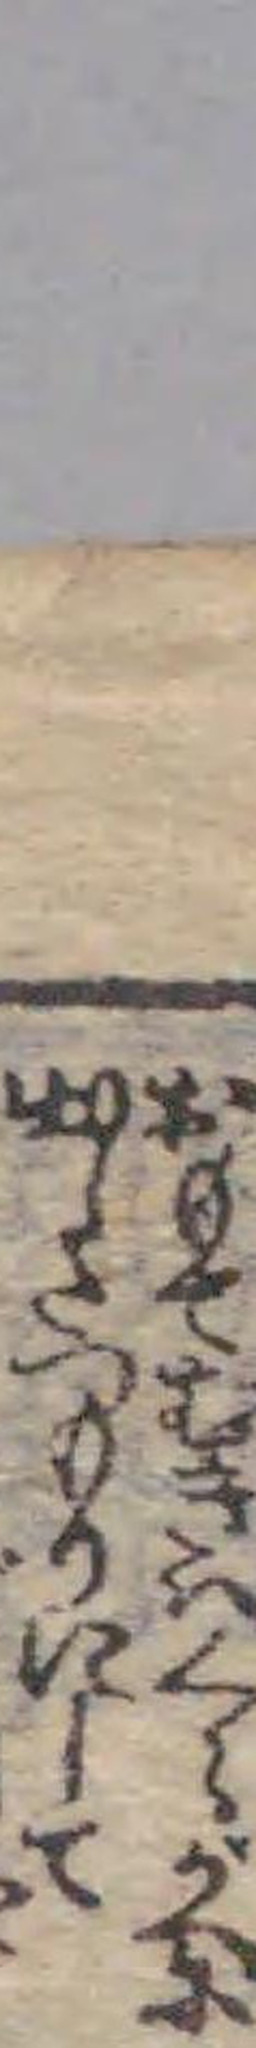出したつもりにして
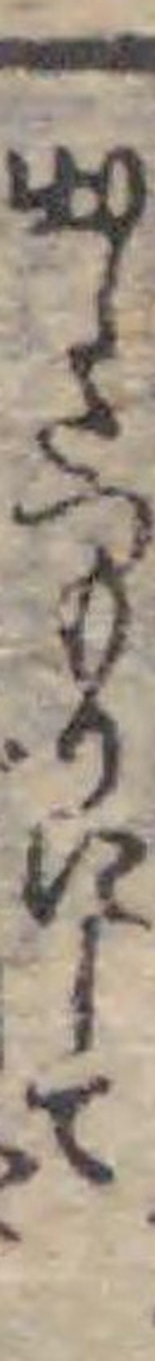出したつもりにして
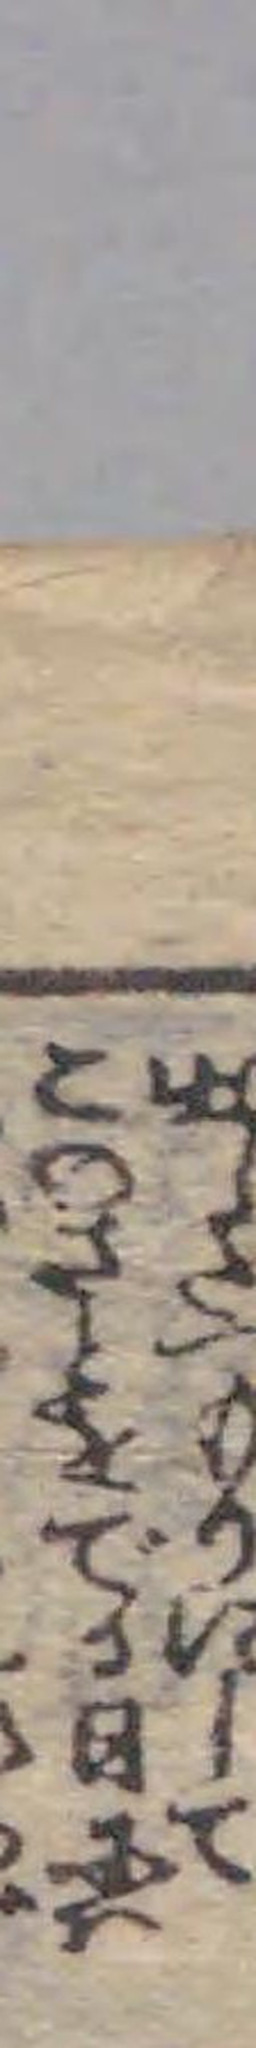このさとを出る日には
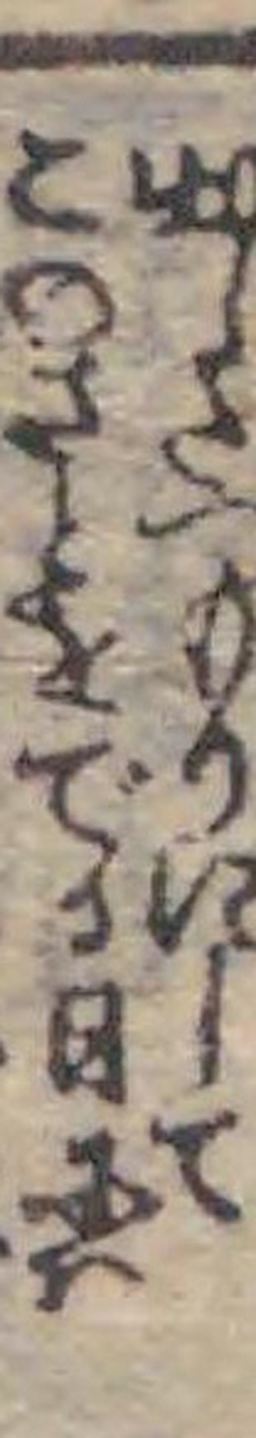このさとを出る日には
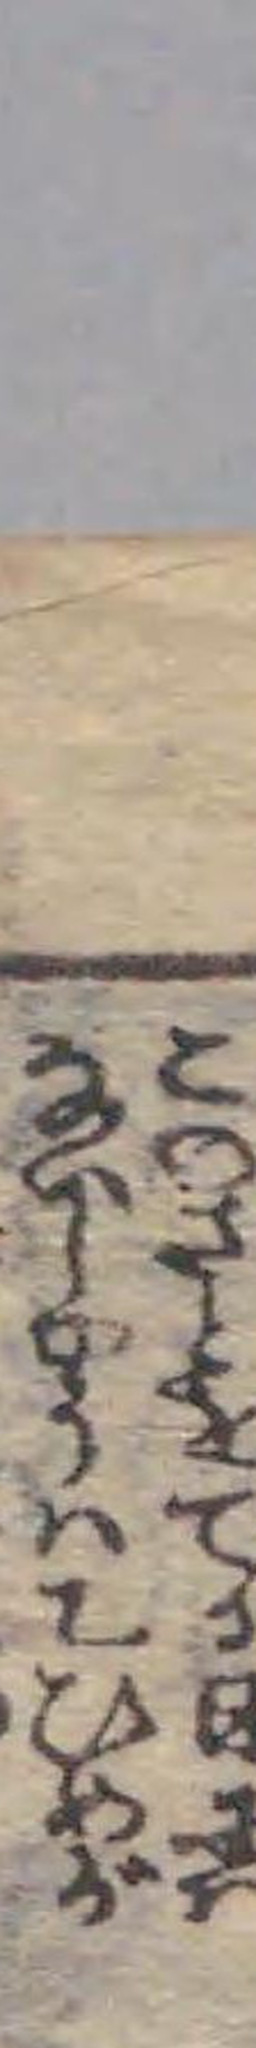ないしやうは乙ひめが
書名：竜宮苦界玉手箱 : 3巻
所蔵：国立国会図書館 National Diet Library, JAPAN
